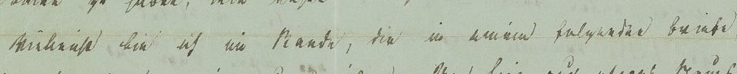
Vielleicht bin ich im Stande, dir in einem folgenden Briefe
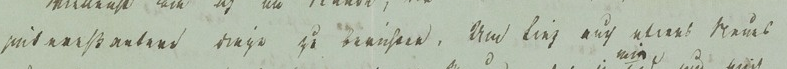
intereßantere Dinge zu berichten. Um Sinz auch etwas Neues
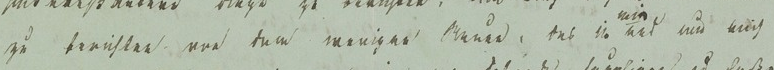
zu berichten von dem wenigen Neuen, das in mir und um mich
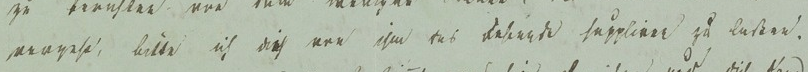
vorgeht, bitte ich dich von ihm das Fehlende suppliren zu laßen.
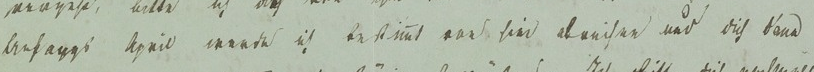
Anfangs April werde ich bestimmt von hier abreisen und dich dann
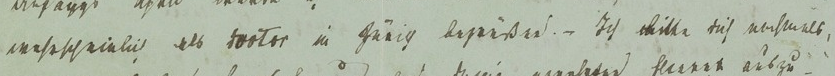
wahrscheinlich als Doctor in Zürich begrüßen. – Ich bitte dich nochmals,
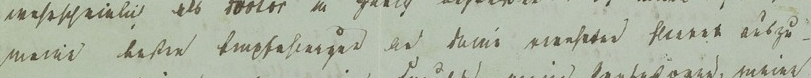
meine besten Empfehlungen an deine verehrten Eltern auszu-
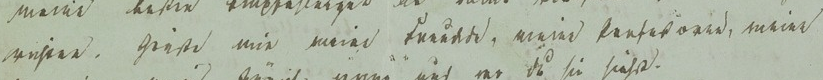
richten. Grüße mir meine Freunde, meine Profeßoren, meine
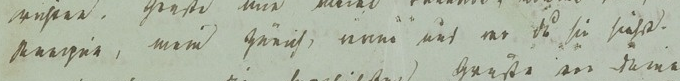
Kneipen, mein Zürich, wann und wo du sie siehst.
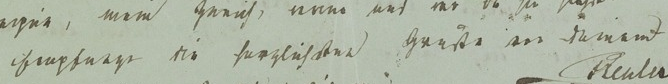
Empfange die herzlichsten Grüße von deinem
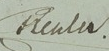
Freuler
